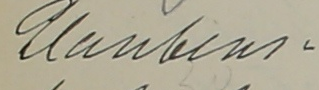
Glaubens
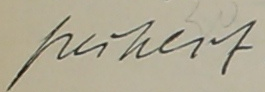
freiheit
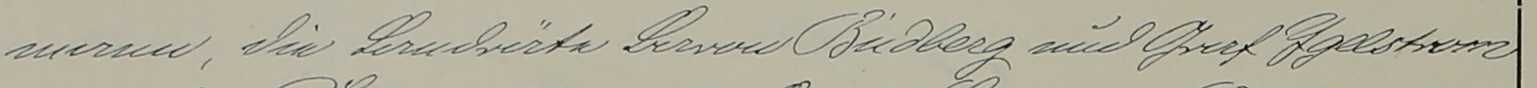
mann, die Landräte Baron Budberg und Graf Igelstrom
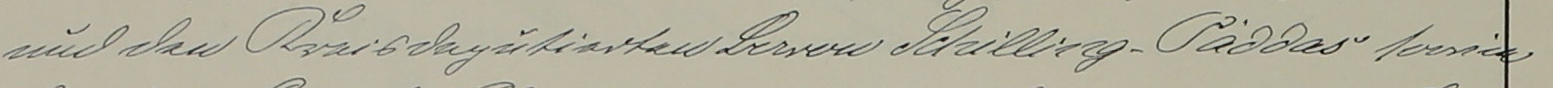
und den Kreisdeputierten Baron Schilling-Paddas sowie
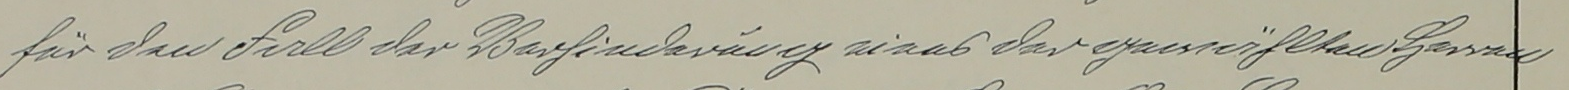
für den Fall der Verhinderung eines der gewählten Herren
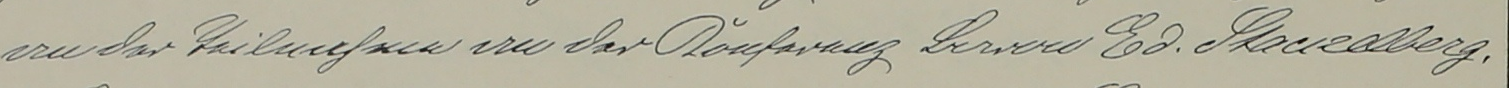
an der Teilnahme an der Konferenz Baron Ed. Stackelberg.
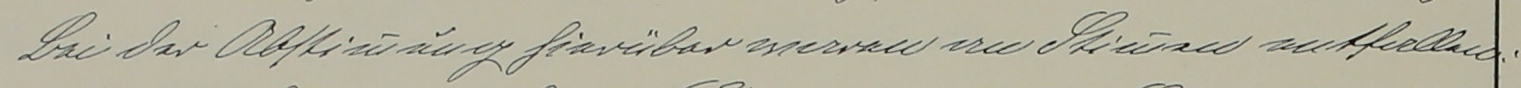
Bei der Abstimmung hierüber waren an Stimmen entfallen:
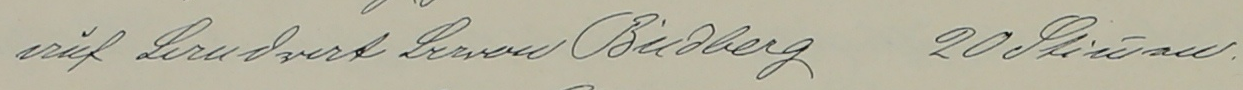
auf Landrat Baron Budberg 20 Stimmen
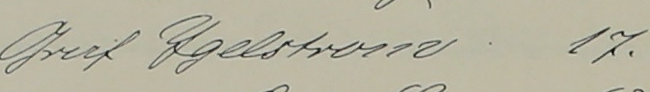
Graf Igelstrom 17
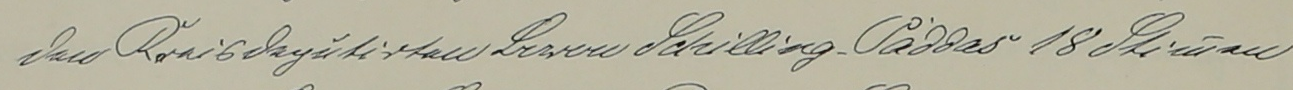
den Kreisdeputirten Baron Schilling-Paddas 18 Stimmen
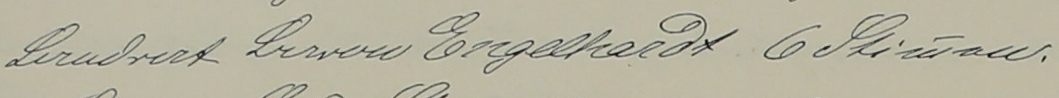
Landrat Baron Engelhardt 6 Stimmen
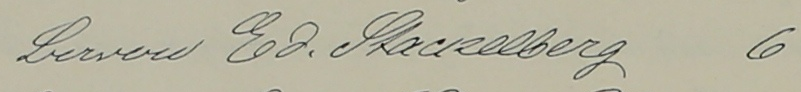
Baron Ed. Stackelberg 6
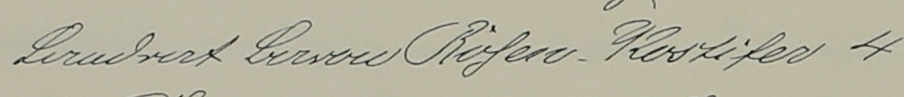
Landrat Baron Rosen-Kostifer 4
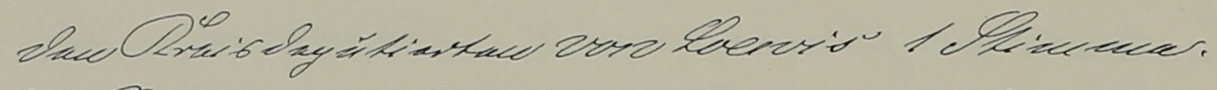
den Kreisdeputierten von Loewis 1 Stimme.
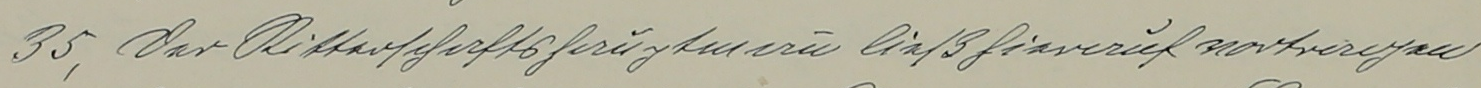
35. Der Ritterschaftshauptmann ließ hierauf vortragen
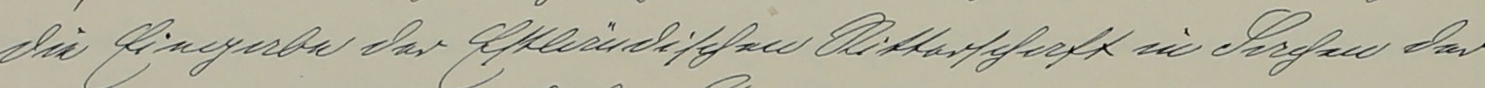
die Eingabe der Estländischen Ritterschaft in Sachen der
